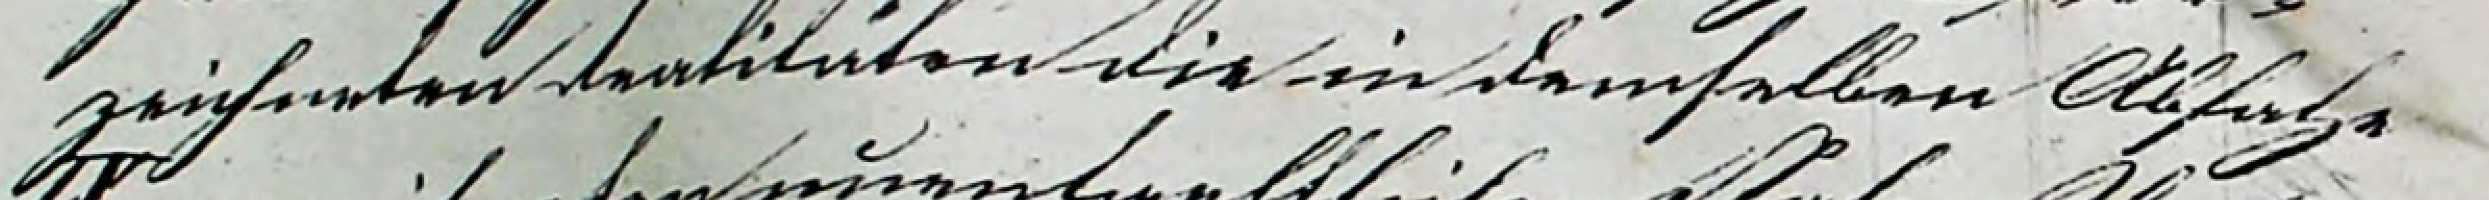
zeichneten Realitäten die in demselben Absatze
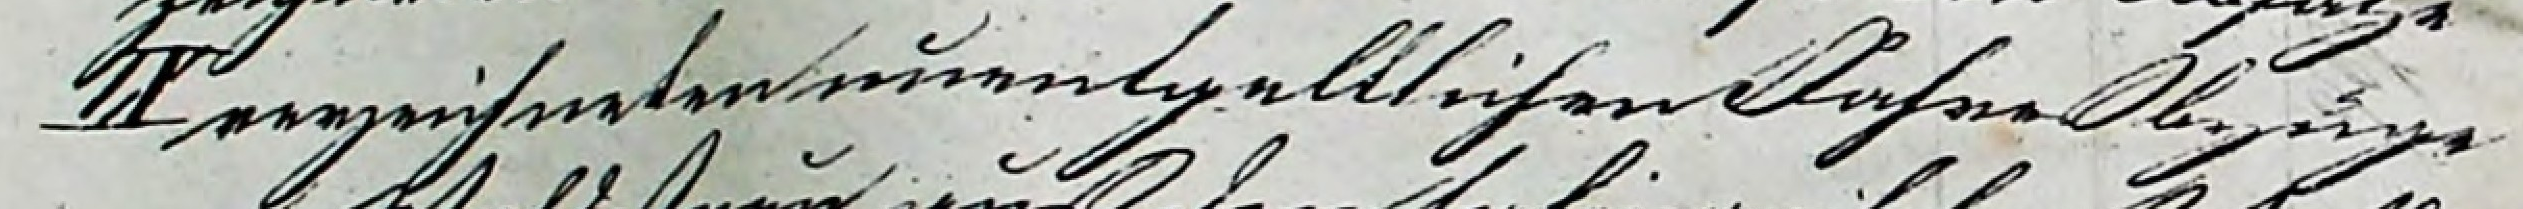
IX verzeichneten unentgeltlichen Jahre Abzüge
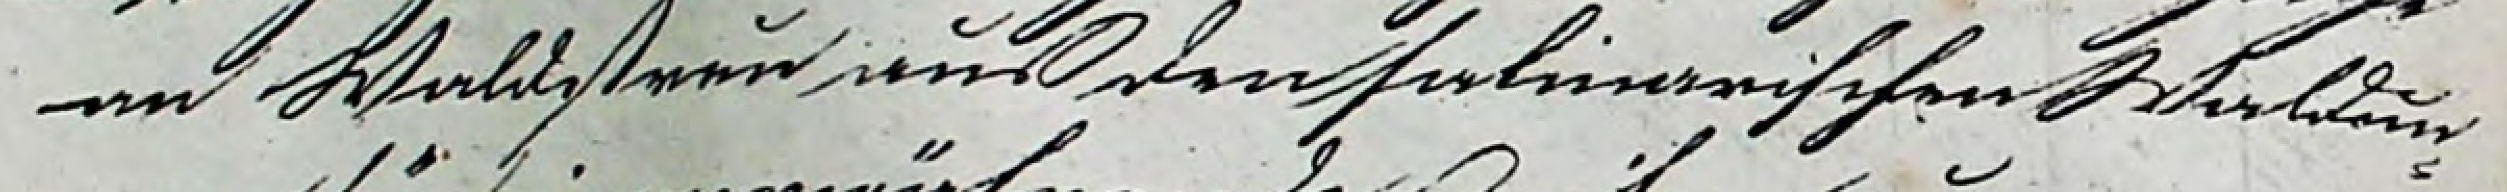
an Waldstreu aus den salinarischen Waldun„
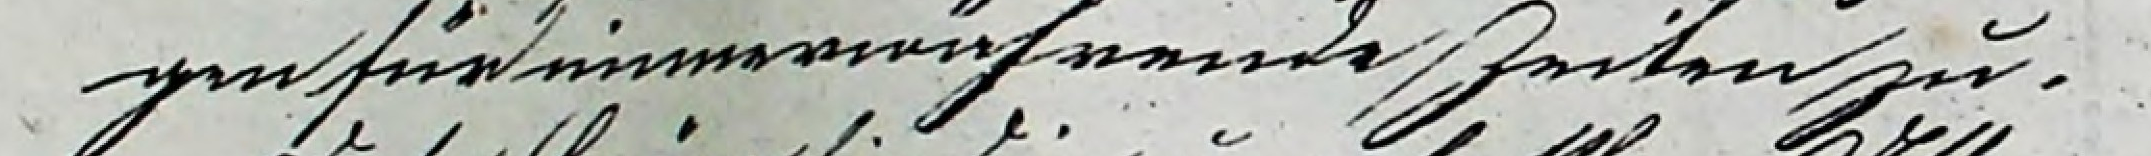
gen für einer währende Zeiten zu.
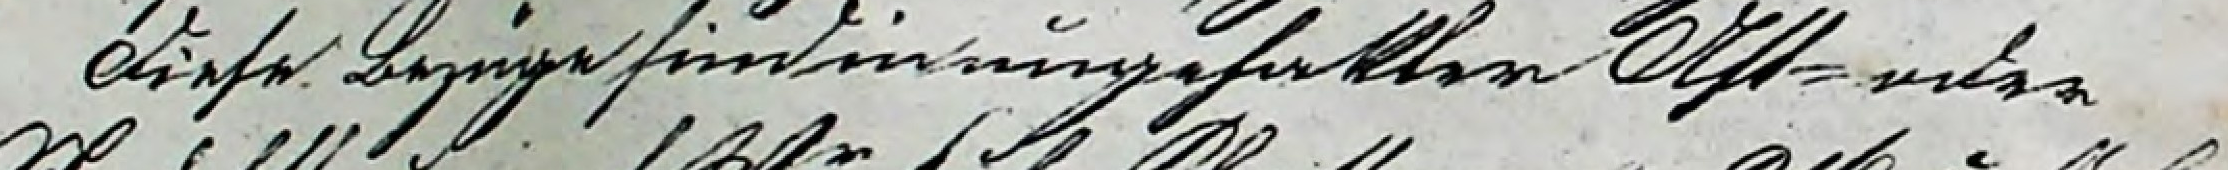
Diese Bezüge sind in ungehallter Ast- oder
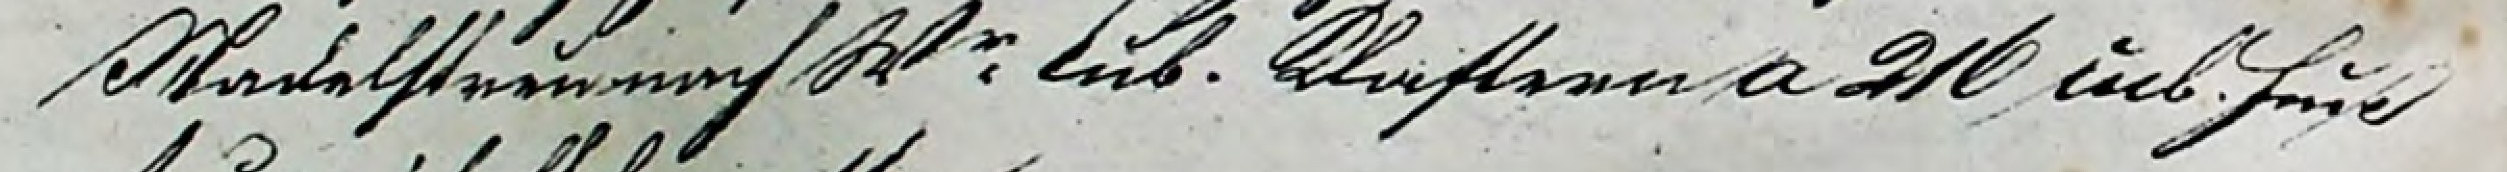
Nadelschreu nach Wr Lub. Klastern a M urb. Heu?
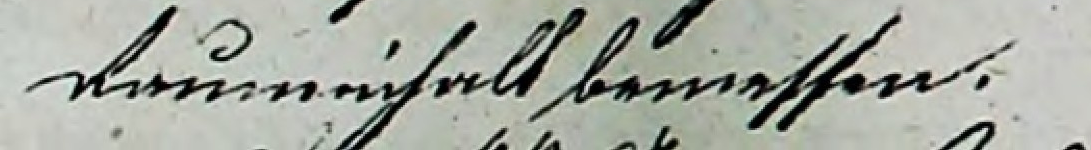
Rauminhalt bemessen.
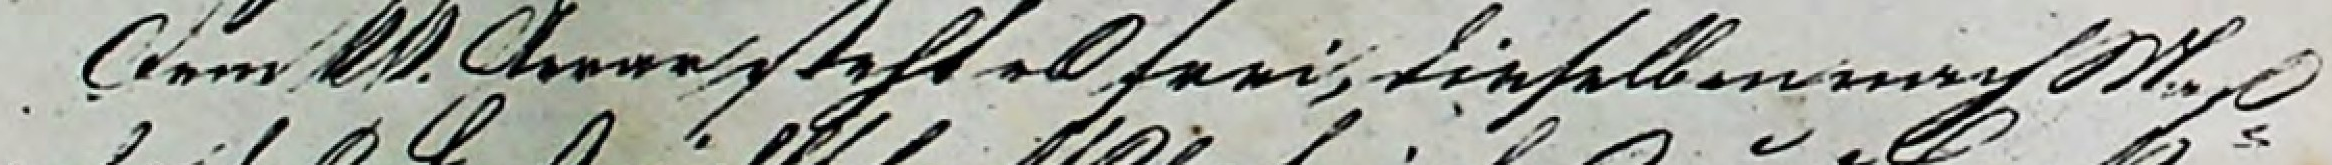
Dem kk. Aerar steht es frei, dieselben nach Mahl„
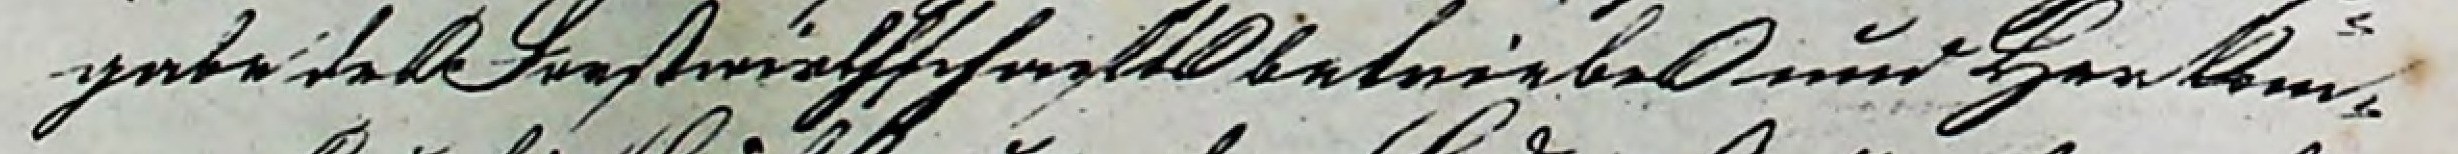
gabe des Forstwirthschaftsbetriebes und Herkom„
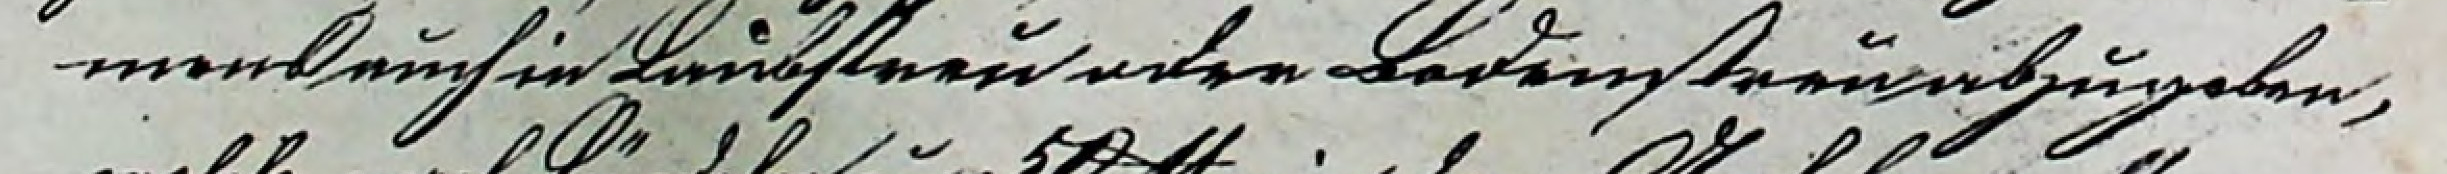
mens auch in Laubstreu oder Ledenstreu abzugeben,
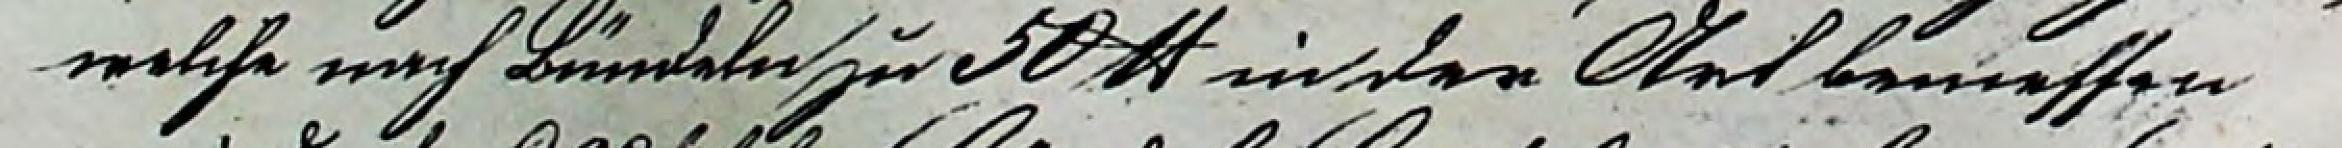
welche nach Bündeln zu 50 tt in der Art bemessen
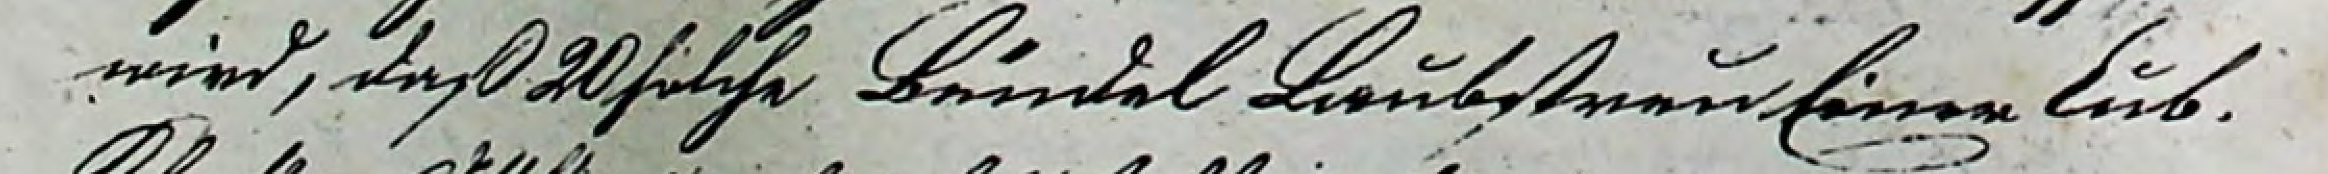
wird, daß folche Bündel Laubstrau Einer Cub.
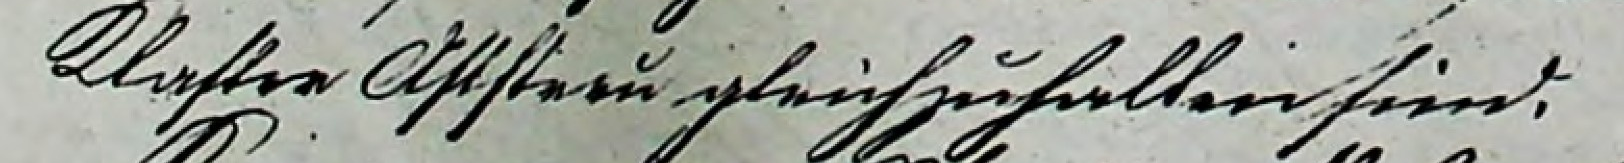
Klaster Aststreu gleichzuhalten sind.
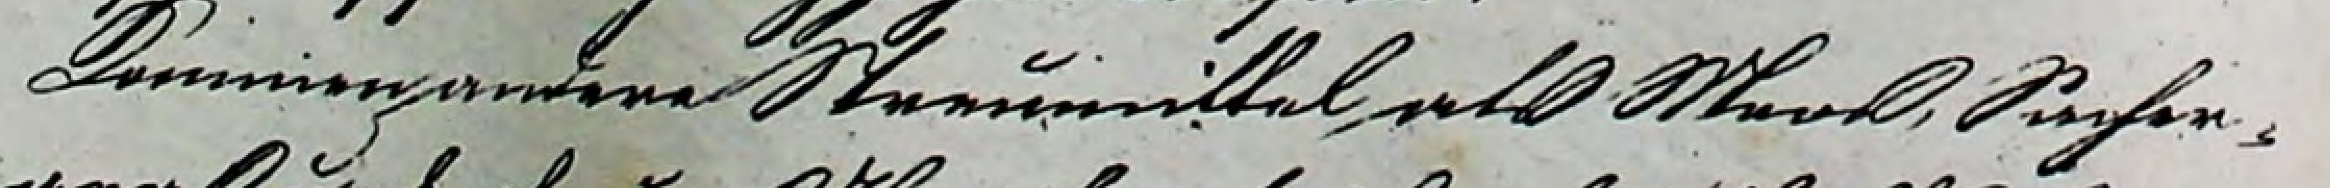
Kommen andere Streumittel als Mark, Sucher„
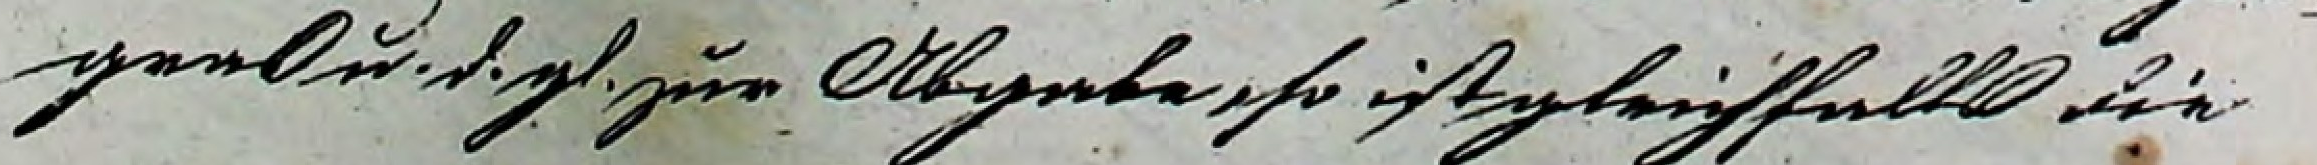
gras u. d. gl. zur Abgabe ihr ist gleichfalls die
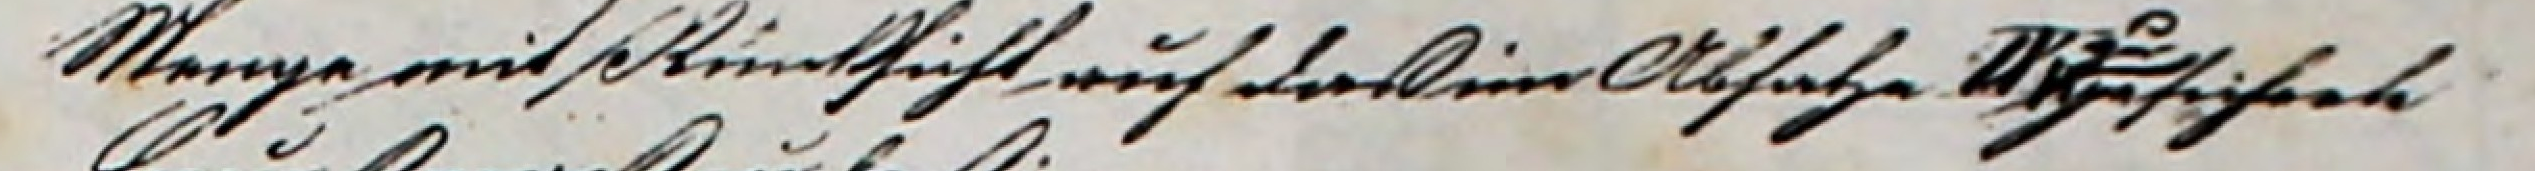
Menge mit Rücksicht auf daß im Absatze ???
